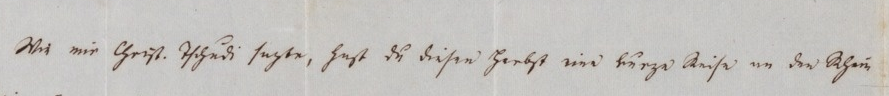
Wie mir Christ. Tschudi sagte, hast du diesen Herbst eine kurze Reise an den Rhein
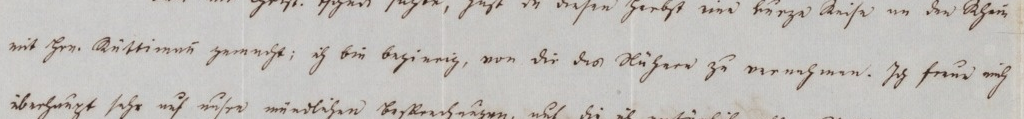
mit Hrn. Rüttimann gemacht; ich bin begierig, von dir das Nähere zu vernehmen. Ich freue mich
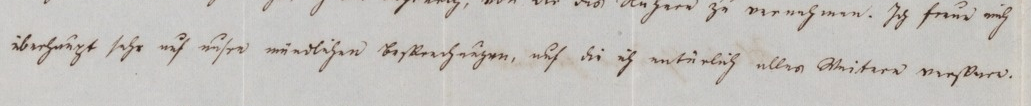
überhaupt sehr auf unsre mündlichen Besprechungen, auf die ich natürlich alles Weitere verspare.
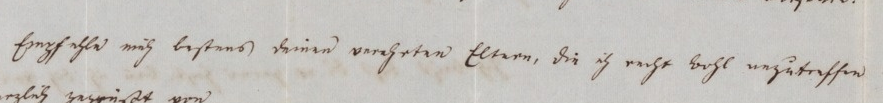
Empfehle mich bestens deinen verehrten Eltern, die ich recht wohl anzutreffen
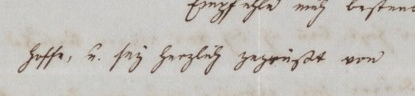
hoffe, u. sey herzlich gegrüßt von
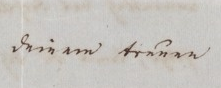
deinem treuen
